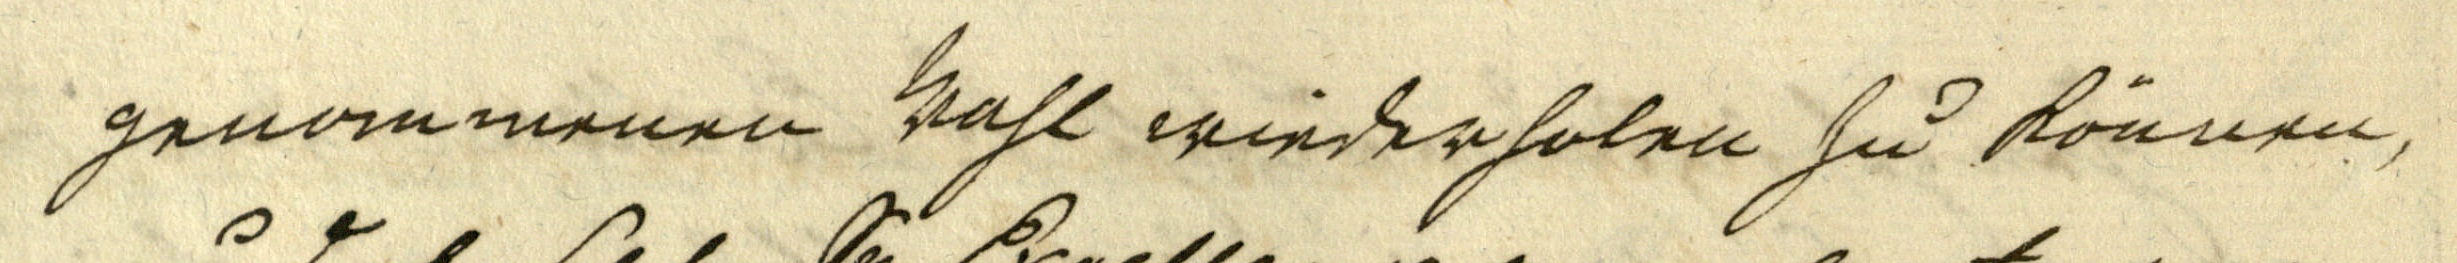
genommenen Wahl wiederholen zu können,
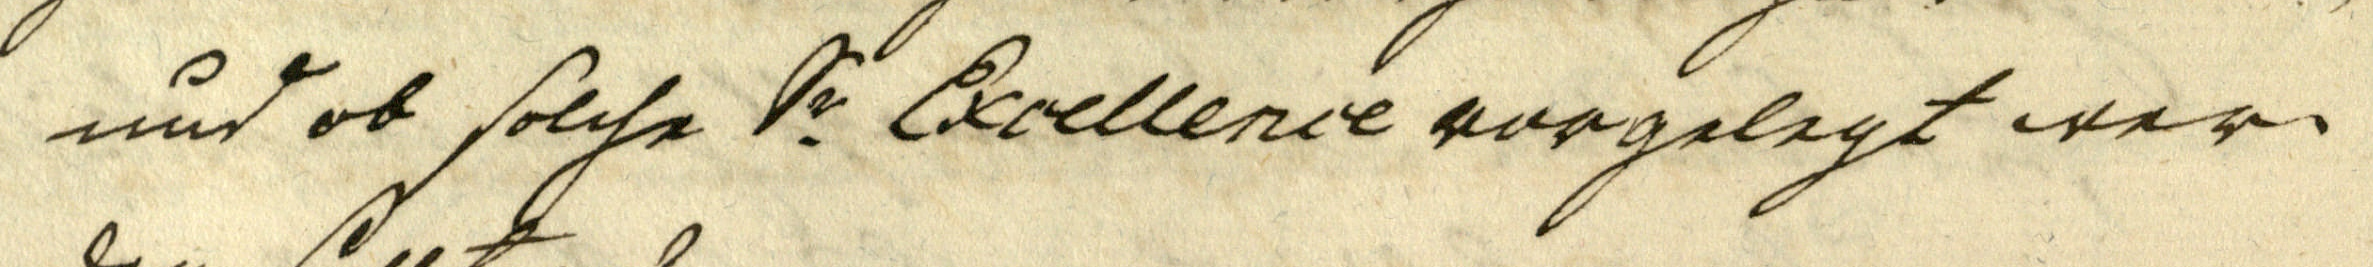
und ob solche Sr Excellence vorgelegt wer¬
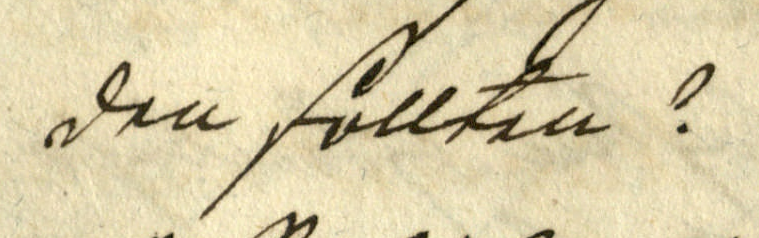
den sollten?
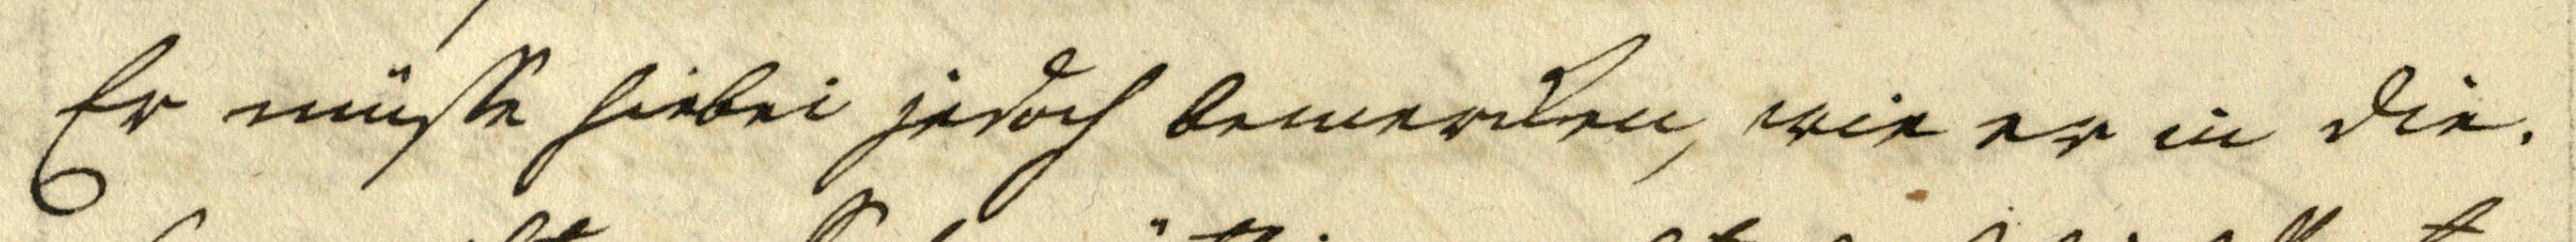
Er müsse hiebei jedoch bemercken, wie er in die¬
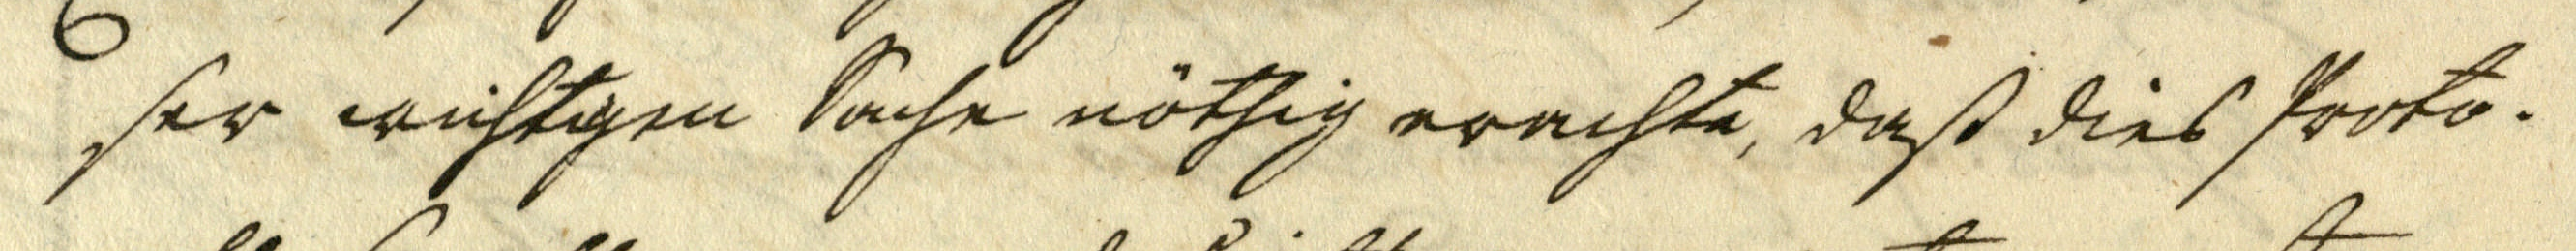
ser wichtgen Sache nöthig erachte, daß dies Proto¬
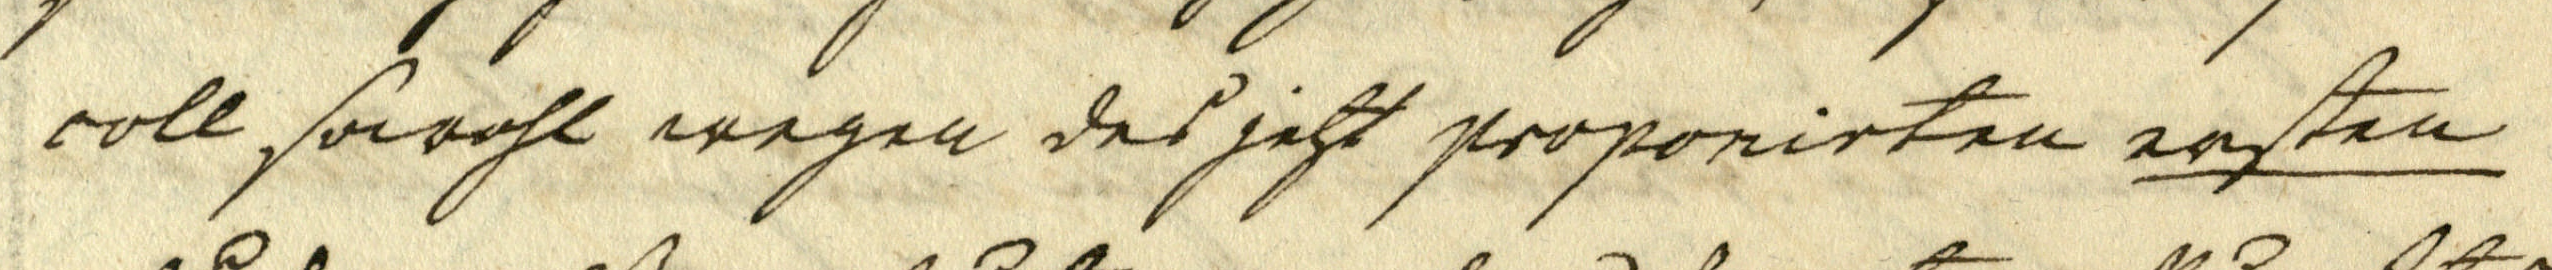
coll sowohl wegen des jetzt proponirten ersten
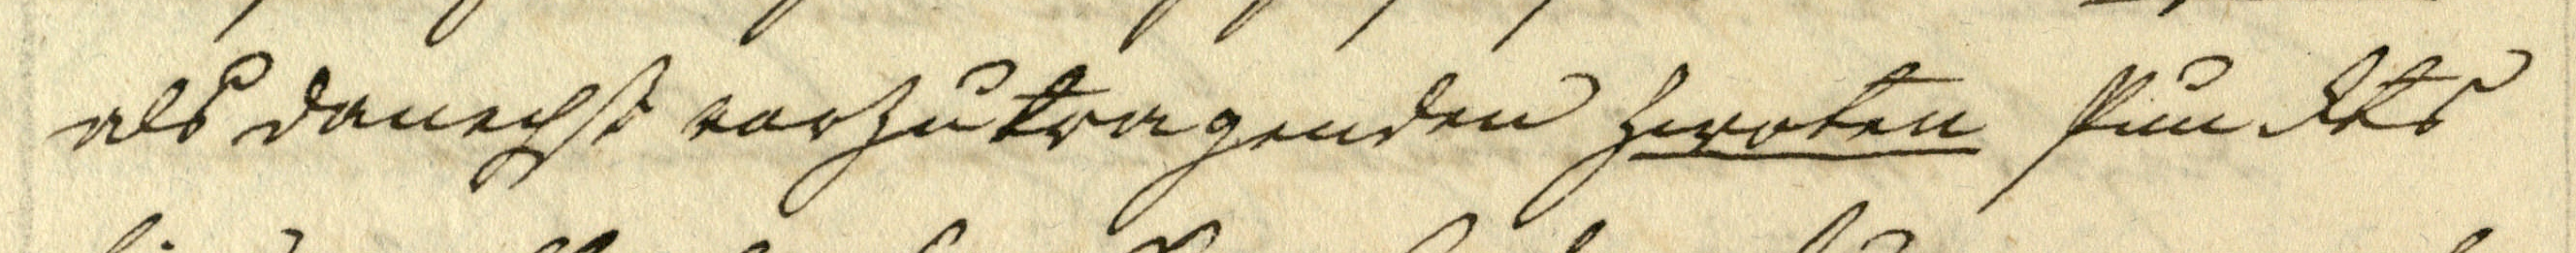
als danechst vorzutragenden zwoten Puncktes
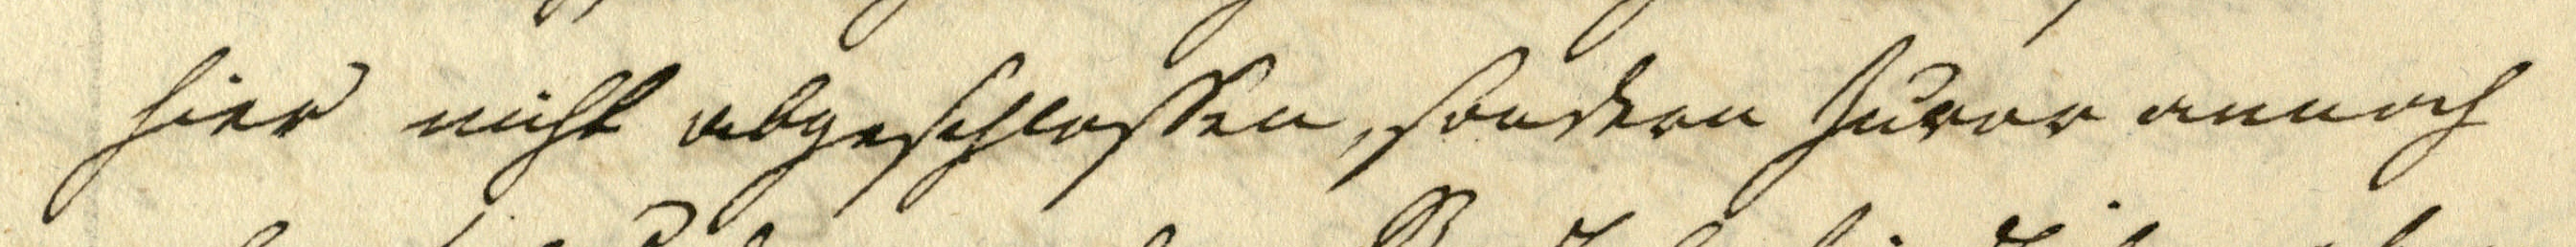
hier nicht abgeschlossen, sondern zuvor annoch
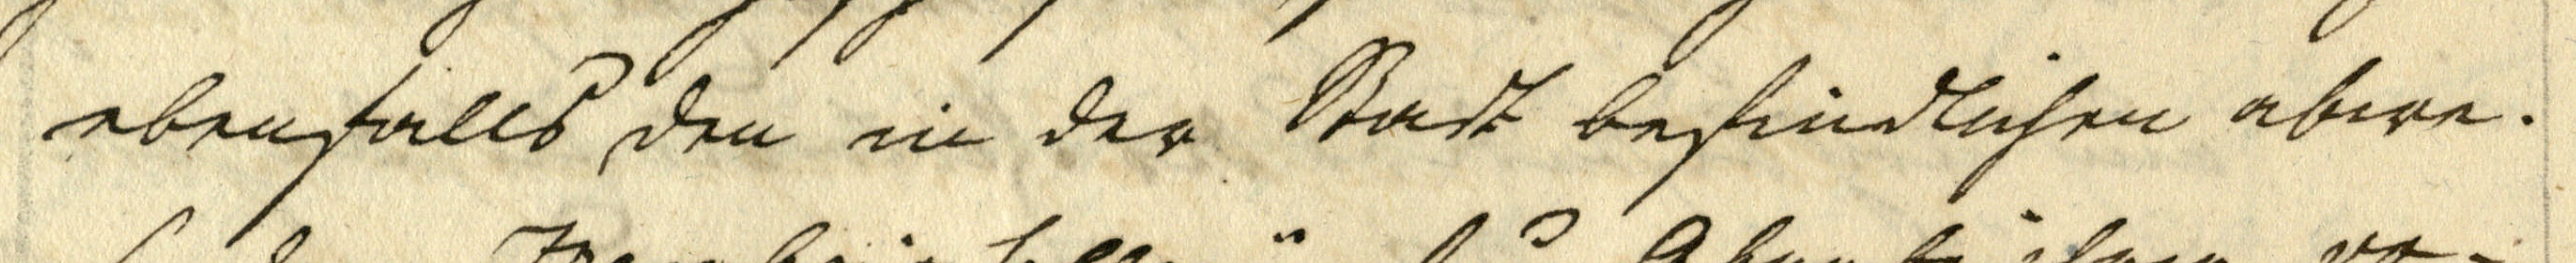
ebenfalls den in der Stadt befindlichen abwe¬
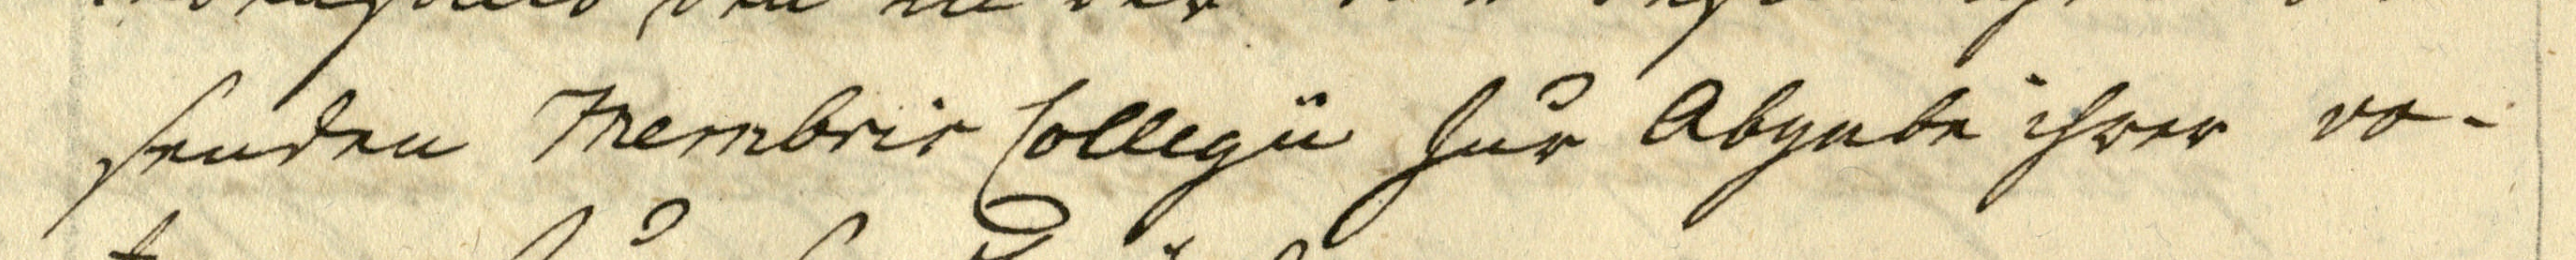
senden Membris Collegii zur Abgabe ihrer vo-
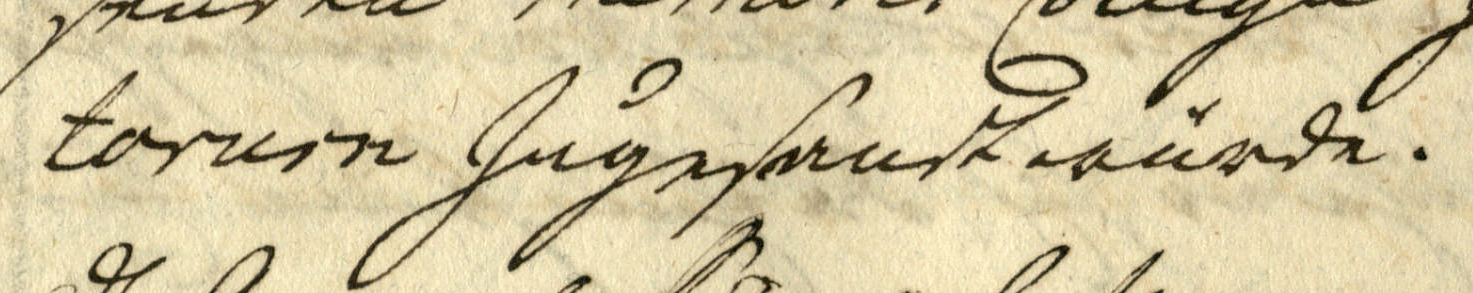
torum zugesandt würde.
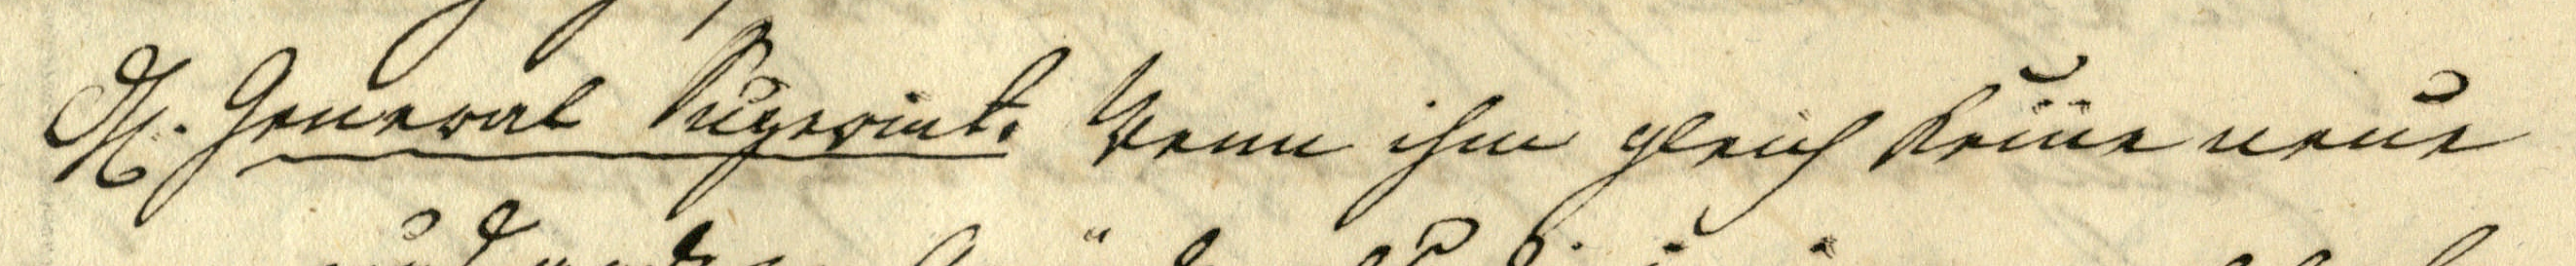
dh. General Superint. Wenn ihm gleich keine neune
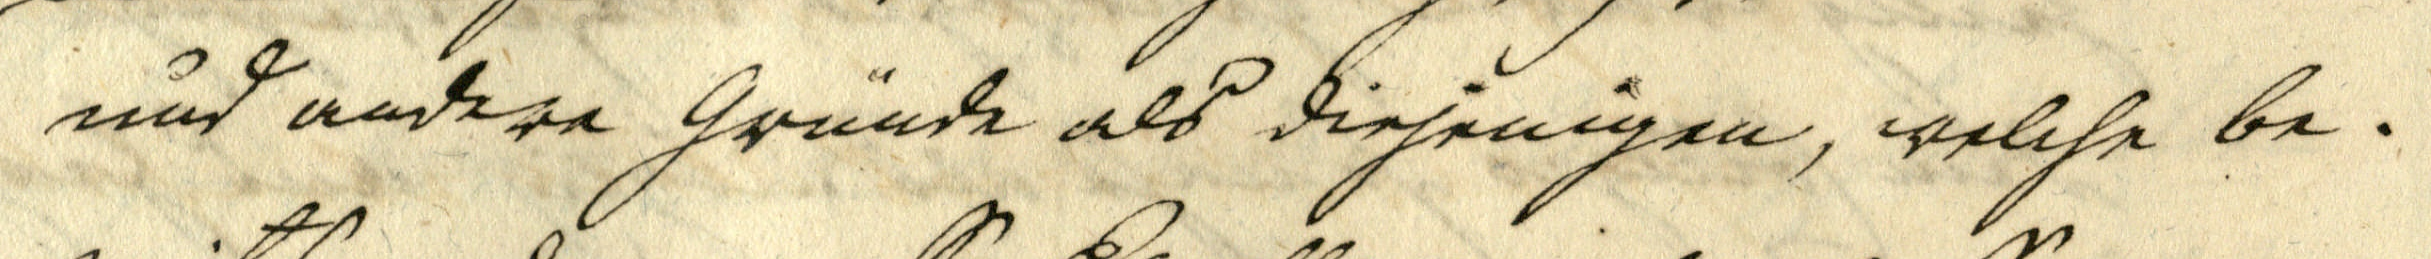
und andere Gründe als diejenigen, welche be¬
